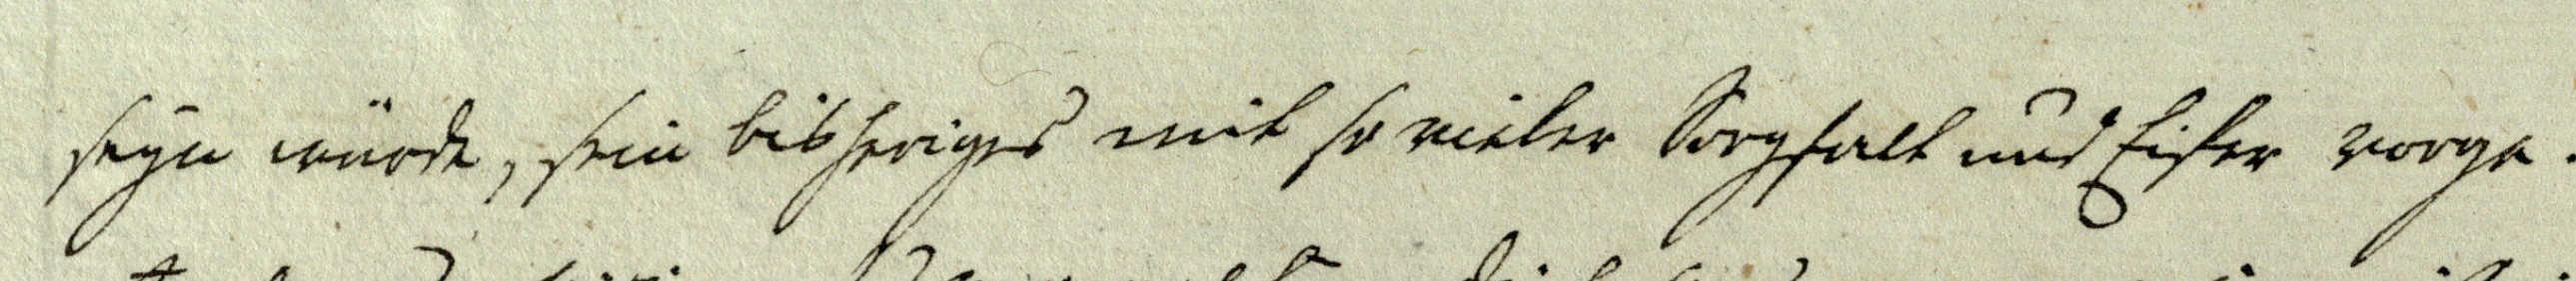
seÿn würde, sein bisheriges mit so vieler Sorgfalt und Eifer vorge¬
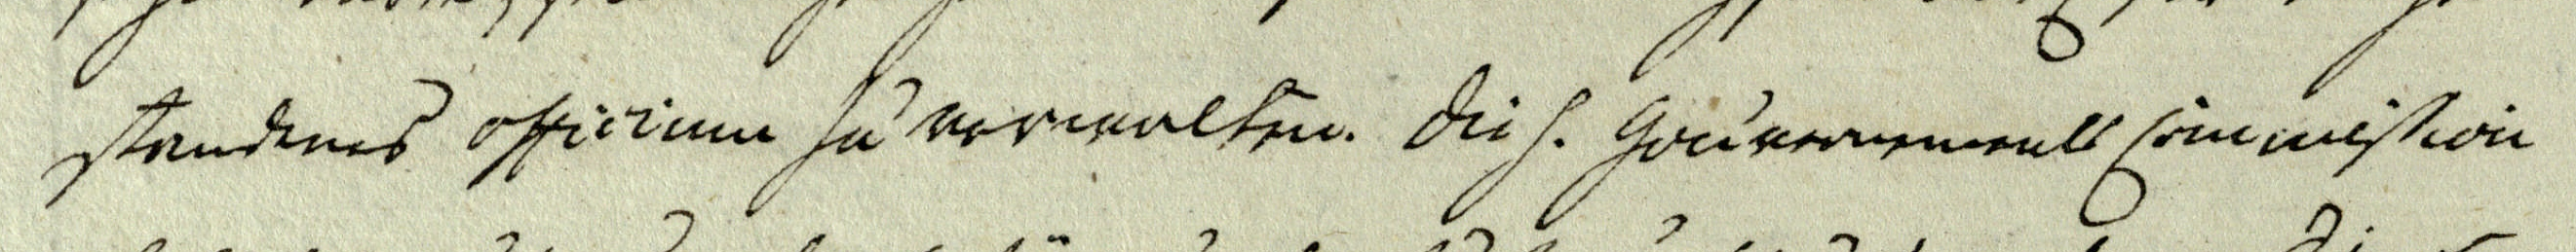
standenes officium zu verwalten. Die h. Gouvernements Commission
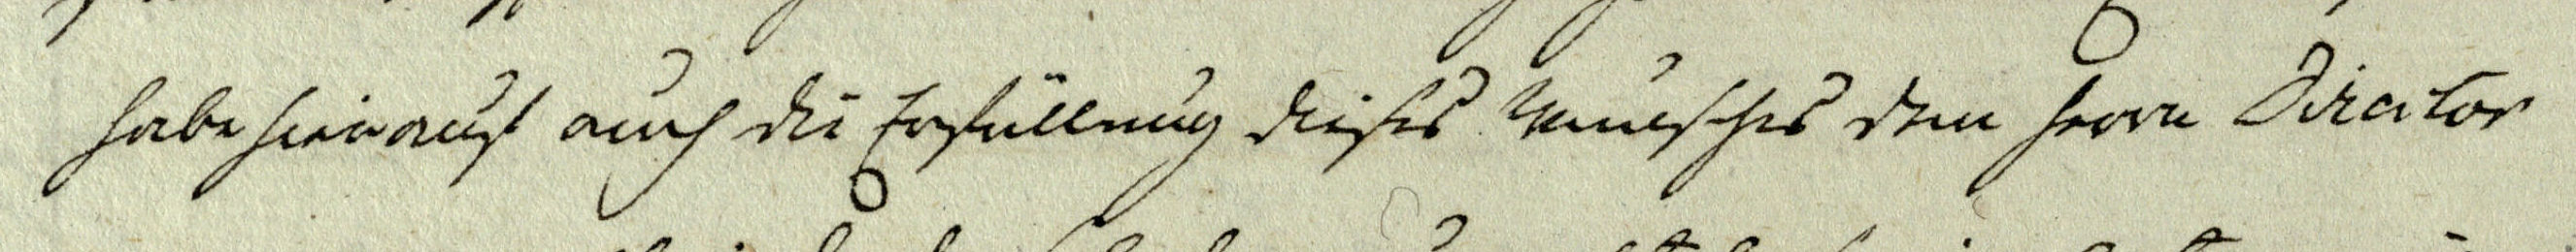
habe hierauf auch die Erfüllung dieses Wunsches dem Herrn Director
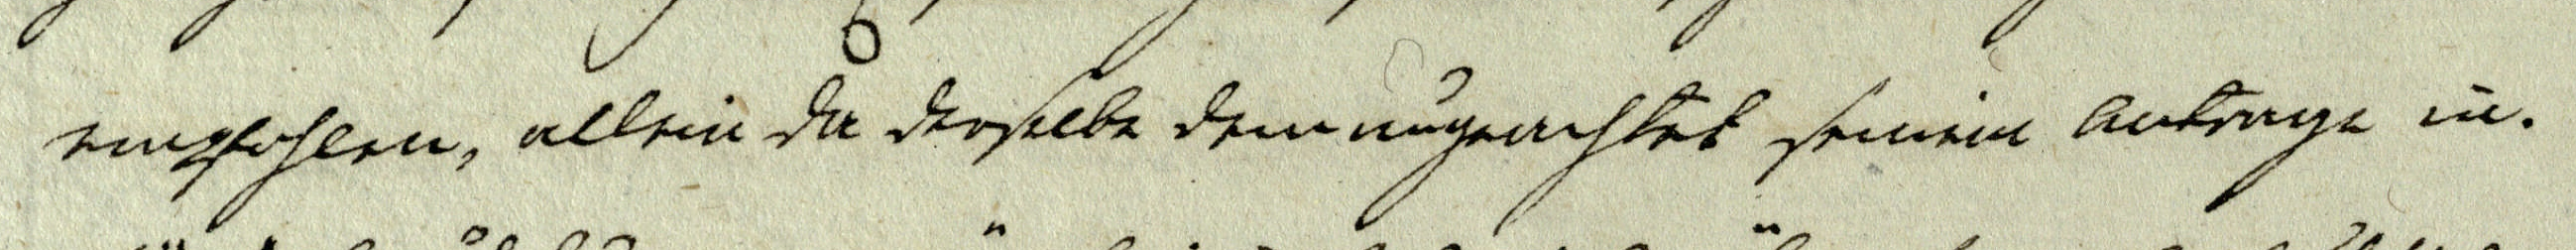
empfohlen, allein da derselbe dem ungeachtet seinem Antrage in¬
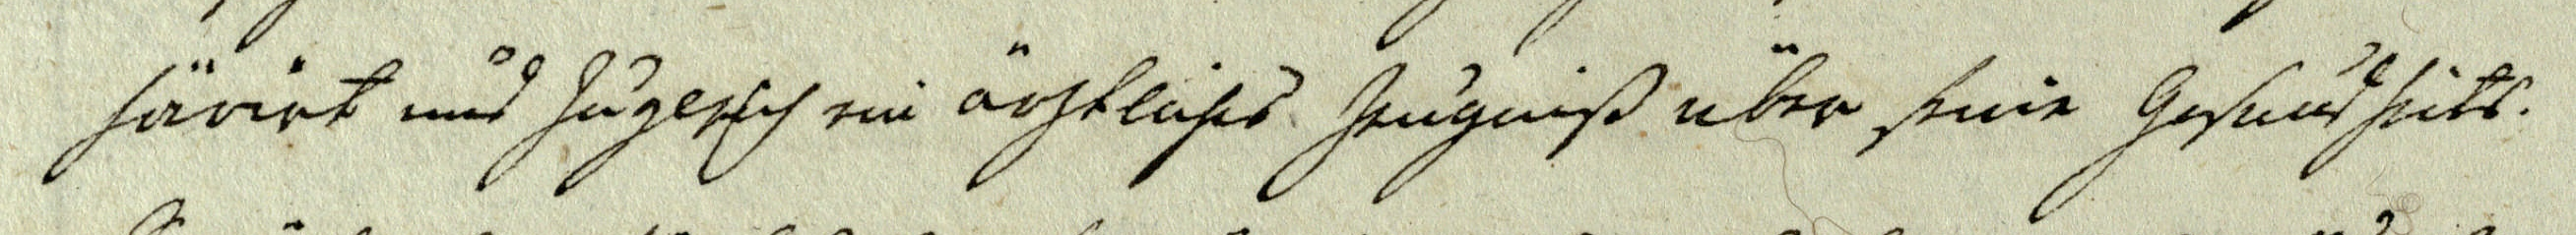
härirt und zugleich ein ärztliches Zeugniß über seine Gesundheits¬
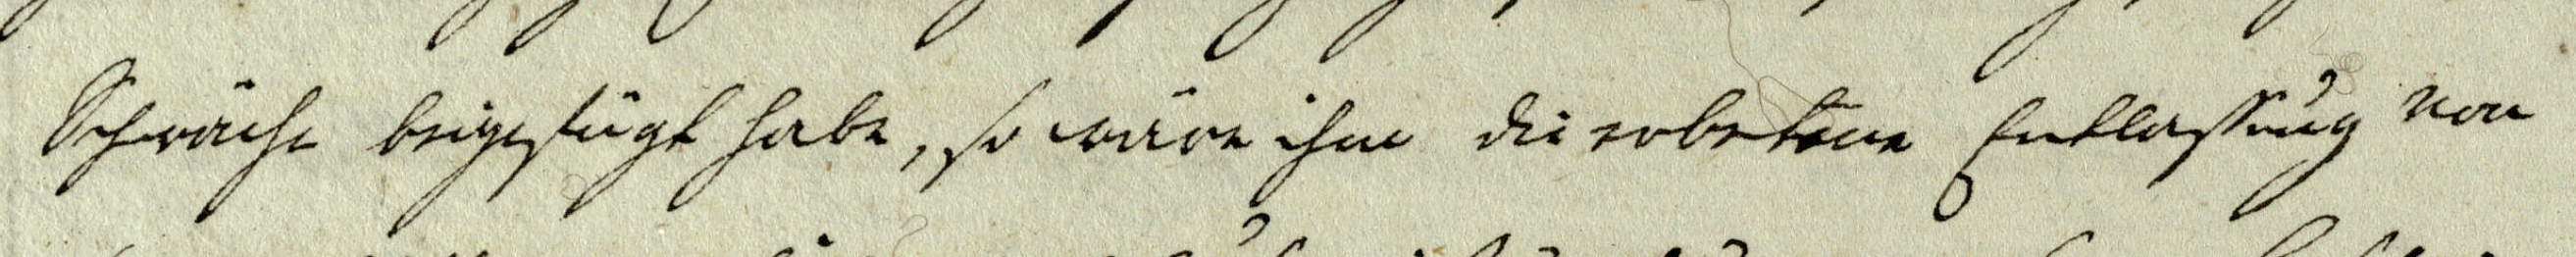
Schwäche beigefügt habe, so wäre ihm die erbetene Entlassung von
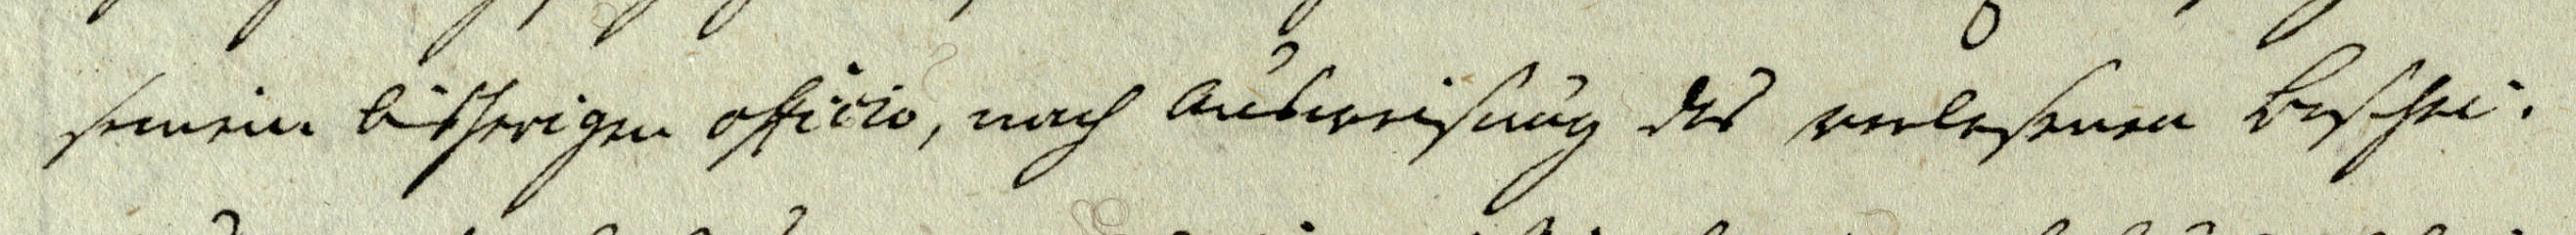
seinem bisherigen officio, nach Ausweisung des verlesenen Beschei¬
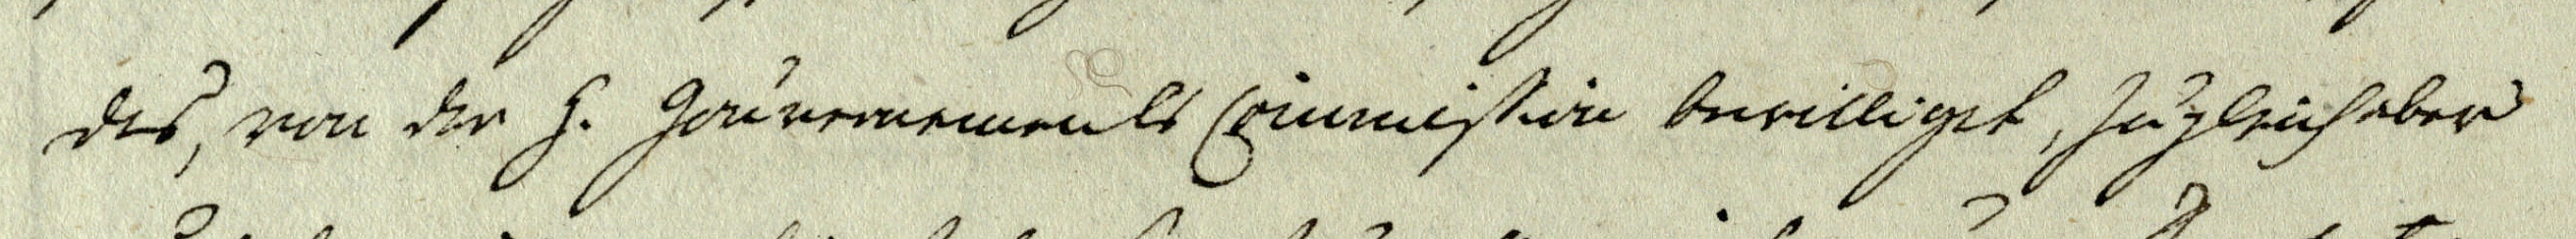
des, von der h. Gouvernements Commission bewilliget, zugleich aber
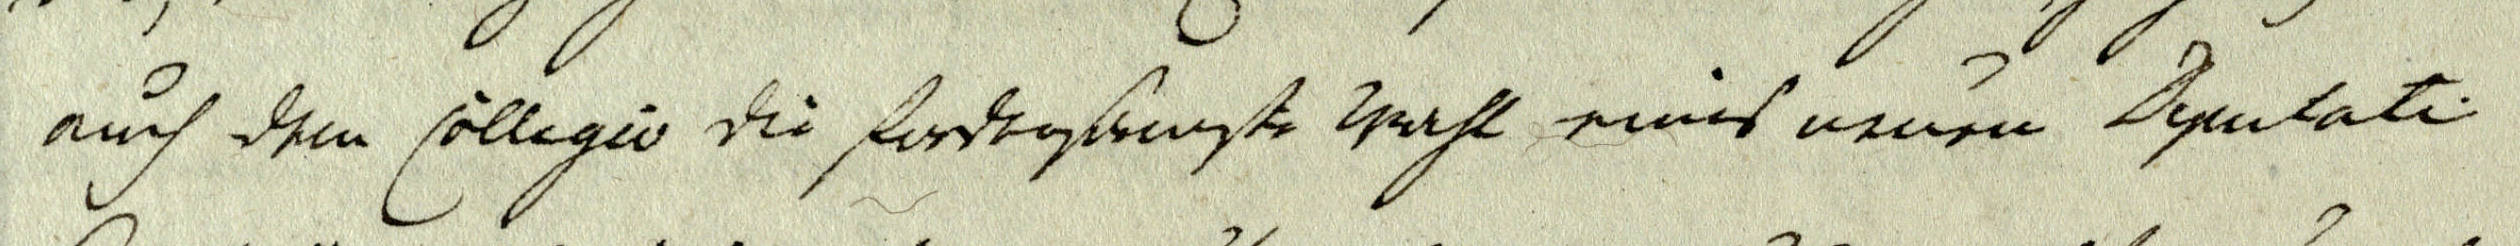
auch dem Collegio die fordersamste Wahl eines neuen Deputati
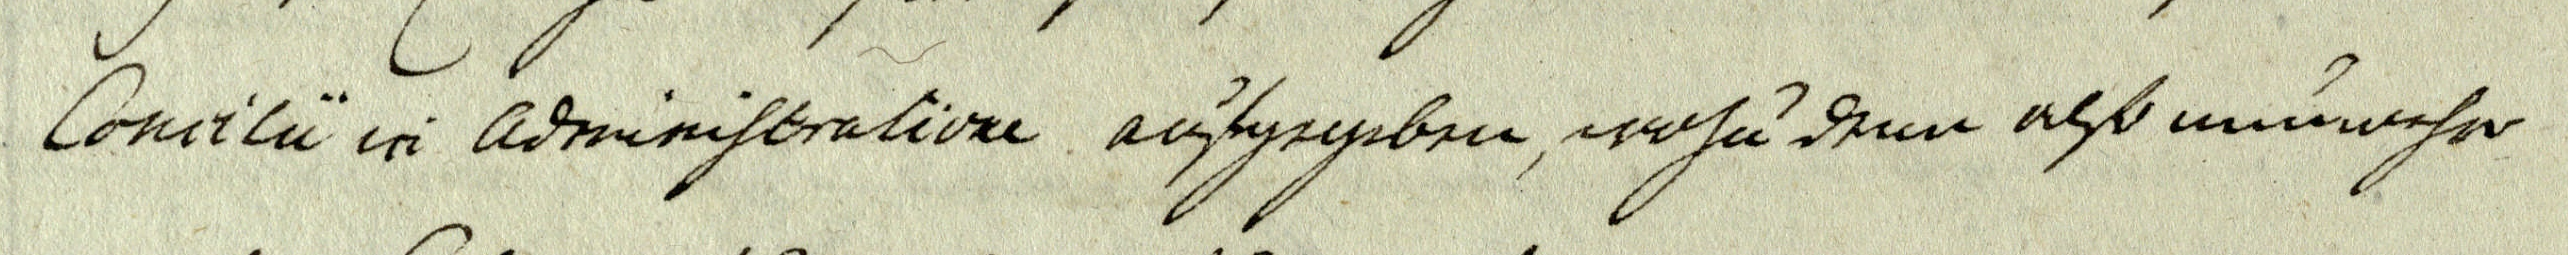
Concilii in Administration aufgegeben, wozu denn also nunmehro
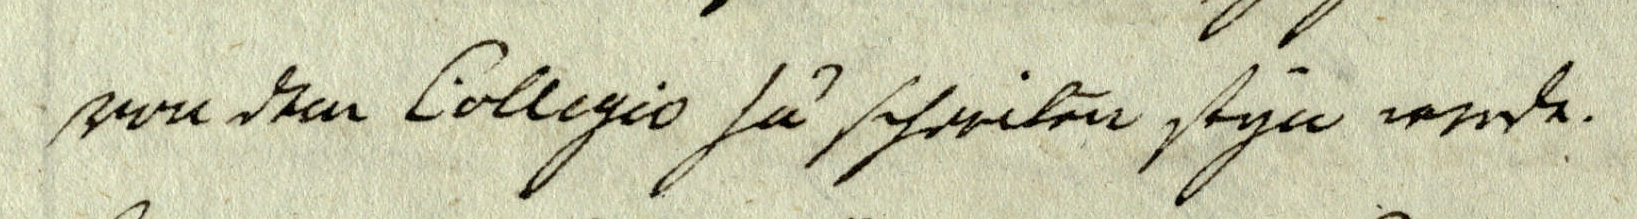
von dem Collegio zu schreiten seÿn werde.
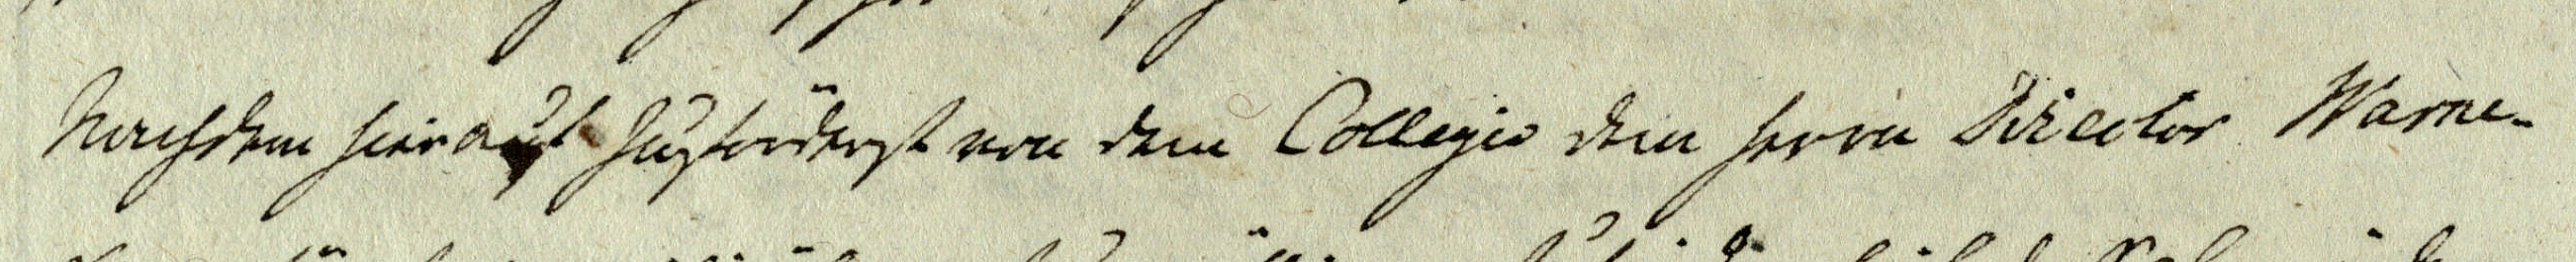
Nachdem hierauf zuförderst von dem Collegio dem Herrn Director Warne¬
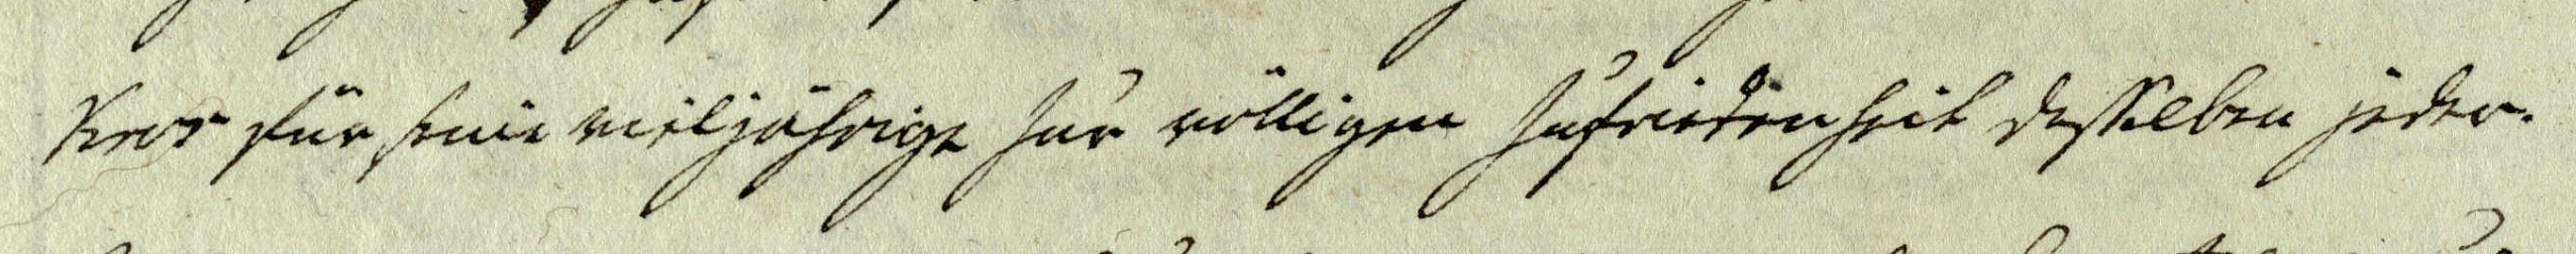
kros für seine vieljährige zur völligen Zufriedenheit desselben jeder
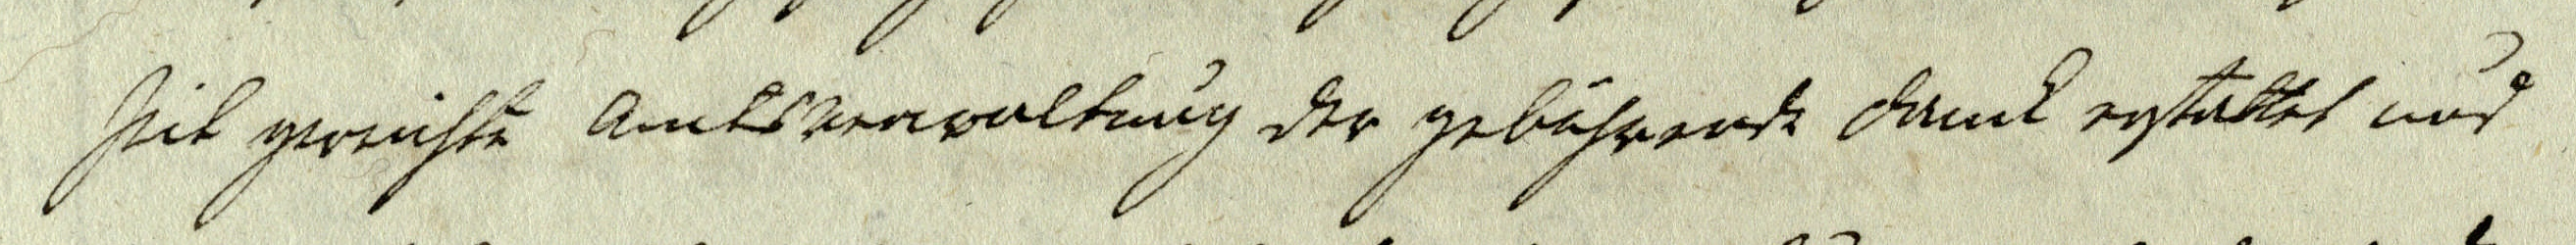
Zeit gereichte Amtsverwaltung der gebührende Dank erstattet und
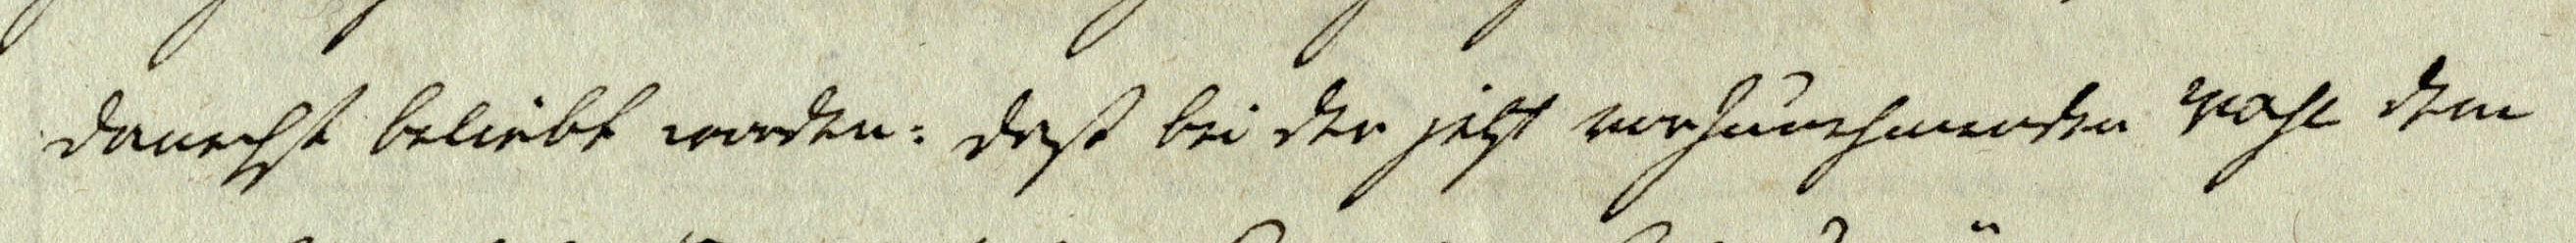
danechst beliebt worden: daß bei der jetzt vorzunehmenden Wahl den
